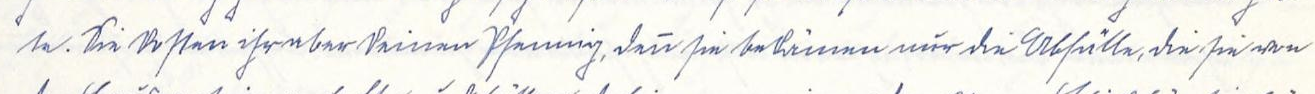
te. Sie kosten ihr aber keinen Pfennig, den sie bekämen nur die Abfälle, die sie von
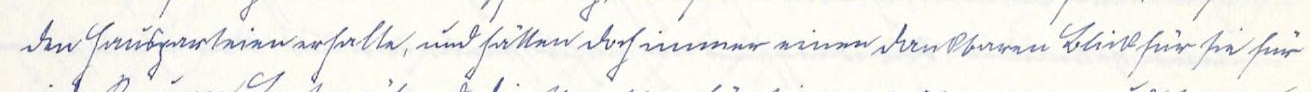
den Hausparteien erhalten, und hätten doch immer einen dankbaren Blick für sie für
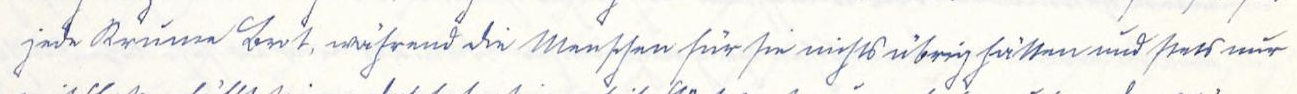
jede Krume Brot, während die Menschen für sie nichts übrig hätten und stets nur
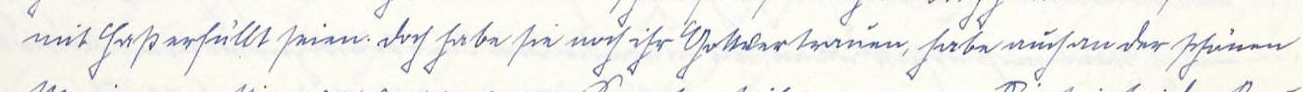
mit Haus erfüllt seien. Doch habe sie nach ihr Gottvertrauen, habe auch an der schönen
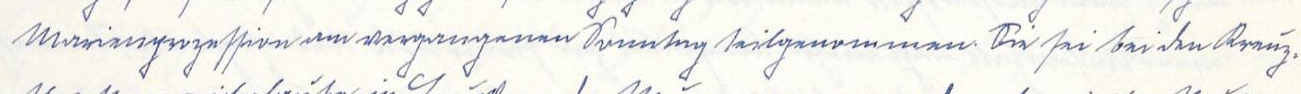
Marienprozession am vergangenen Sonntag teilgenommen. Sie sei bei den Kreuz-
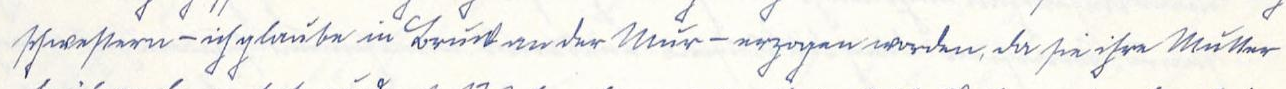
schwestern - ich glaube in Bruck an der Mur- erzogen worden, da sie ihre Mutter
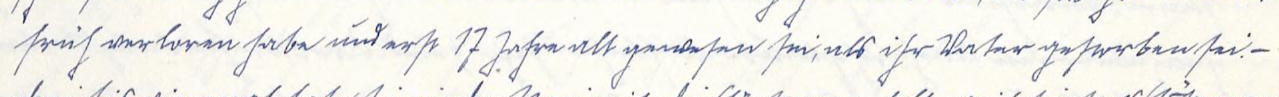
früh verloren habe und erst 17 Jahre alt gewesen sei, als ihr Vater gestorben sei.
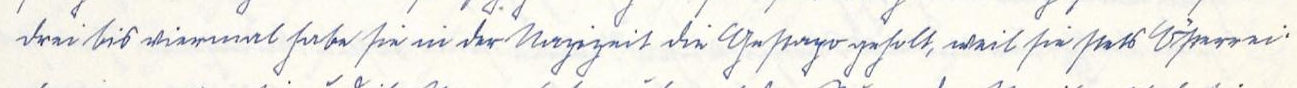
Drei bis viermal habe sie in der Nazizeit die Gestapo geholt, weil sie stets Österrei-
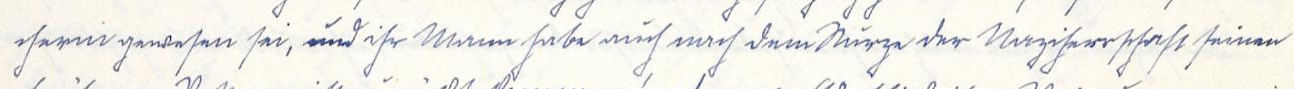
cherin gewesen sei, und ihr Mann habe auch nach dem Sturze der Naziherrschaft seinen
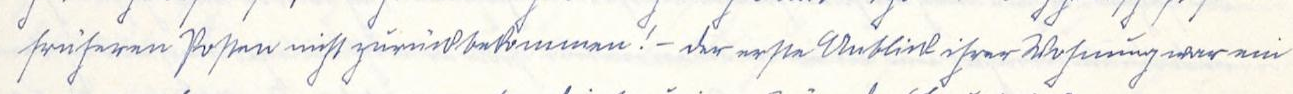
früheren Posten nicht zurückbekommen!- Der erste Anblick ihrer Wohnung war ein
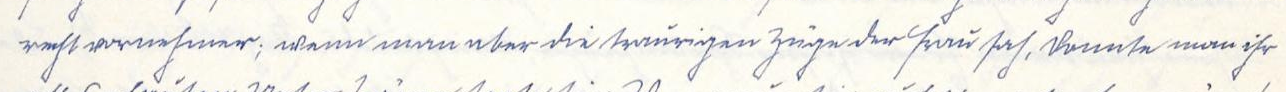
recht vornehmer; wenn man aber die traurigen Züge der Frau sah, konnte man ihr
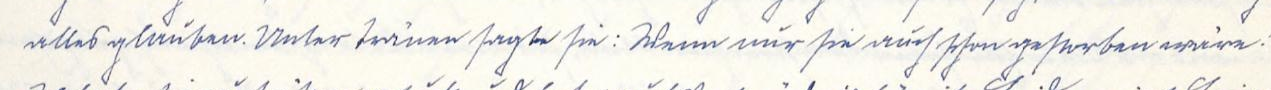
alles glauben. Unter Tränen sagte sie: Wenn nur sie auch schon gestorben wäre!
